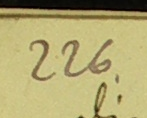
228
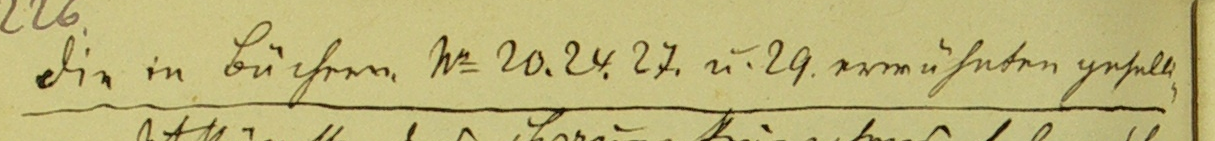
Die in den Büchern Nr: 20, 24, 27, und 29.erwähnten geselli¬
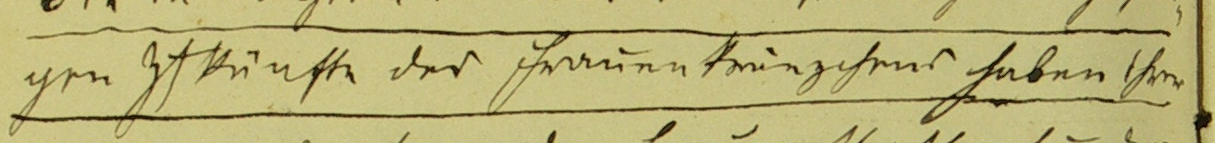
gen Zusammenkünfte des Frauenkränzchens haben ihre
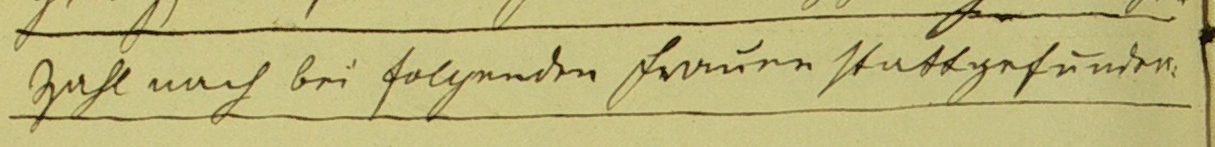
Zahl nach bei folgenden Frauen stattgefunden:
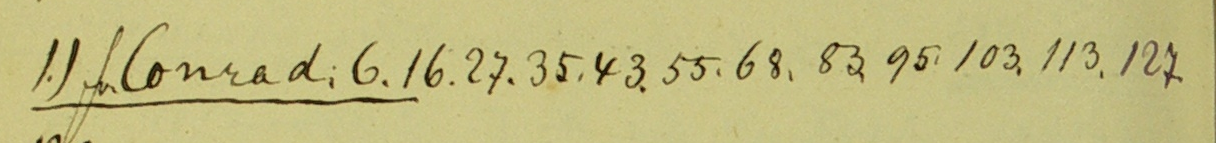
1) Fr. Conrad: 6.16.27.35.43.55.68.83.95.103.113.127.
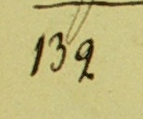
139.
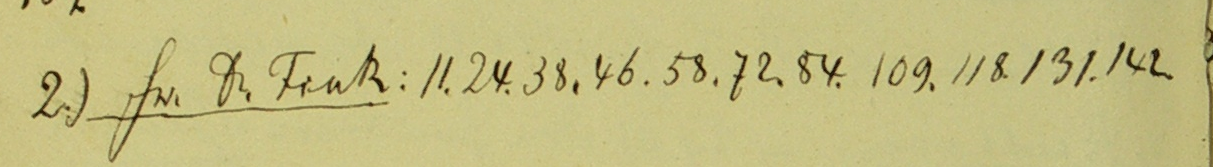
2) Fr. Dr. Fink; 11.24.38.46.58.72.84.109.118.131.142
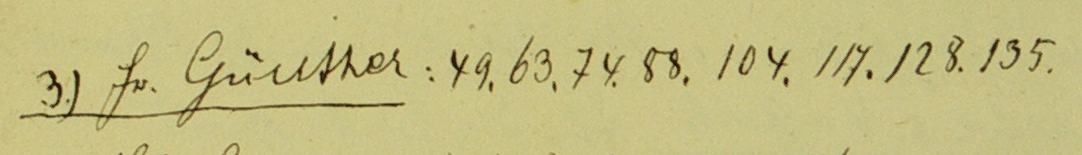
3) Fr. Günther. 49.63.74.88.104.117.128.135.
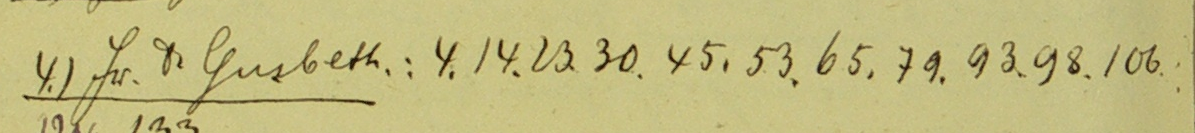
4) Fr. Dr. Gusbeth: 4.14.23.30.45.53.65.79.93.98.106.
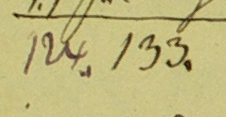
124.133.
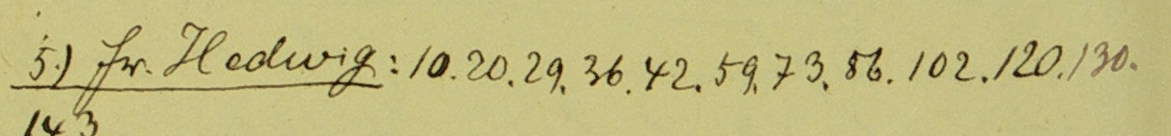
5) Fr. Hedwig: 10.20.29.36.42.59.73.86.102.120.130.
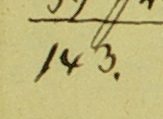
143.
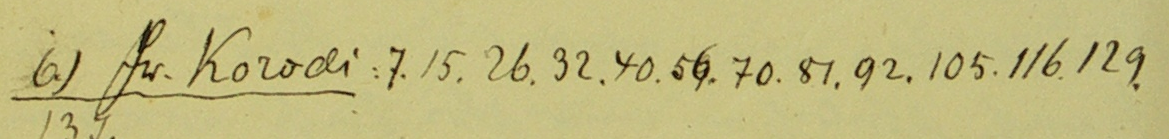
6) Fr. Korodi: 7.15.26.32.40.56.70.81.92.105.116.129.
